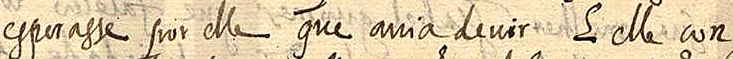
esperasse por elle que auia de uir E elle con
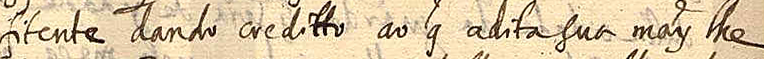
fitente dando creditto ao q̄ a dita sua maỹ lhe
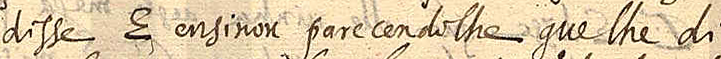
disse E ensinou parecendolhe que lhe di
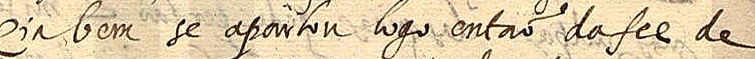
zia bem se apartou logo entaõ da fee de
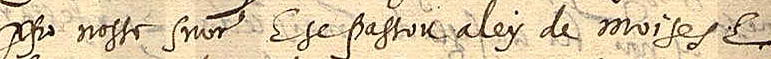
xpo nosso snor̄ E se passou a ley de moises E
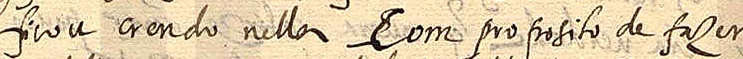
ficou crendo nella Com proposito de fazer
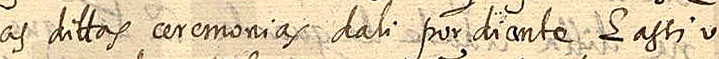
as dittas ceremonias dali por diante E assi o
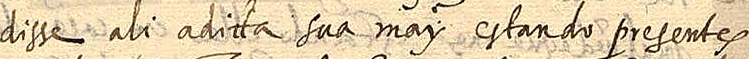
disse ali a ditta sua maỹ estando presentes
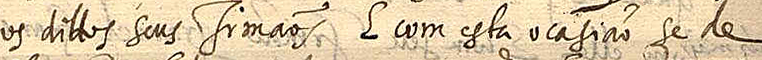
os dittos seus Jrmaõs E com esta ocasiaõ se de
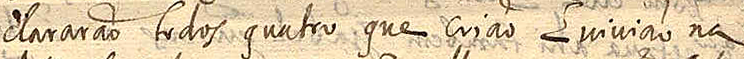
clararão todos quatro que criaõ E uiuião na
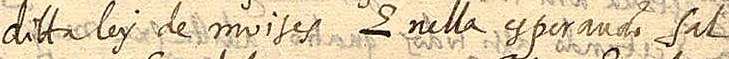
ditta ley de moises E nella esperauão sal
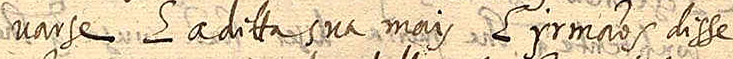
uarse E a ditta sua may E yrmaõs disse
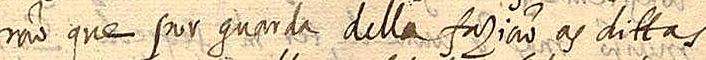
raõ que por guarda della faziaõ as dittas
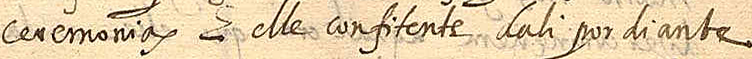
ceremonias E elle confitente dali por diante
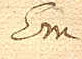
Em
